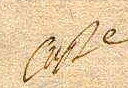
Custe
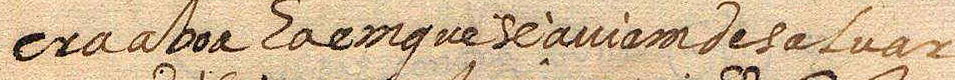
era a boa E a em que auiam de saluar
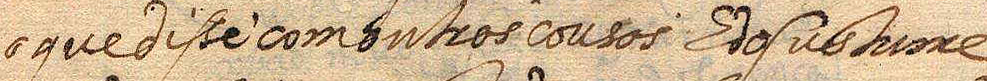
o que disse com outras cousas E do Custume
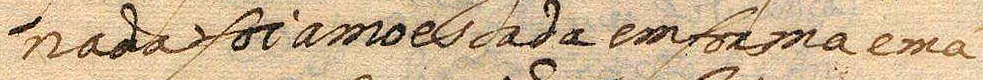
nada foi amoestada em forma e mā
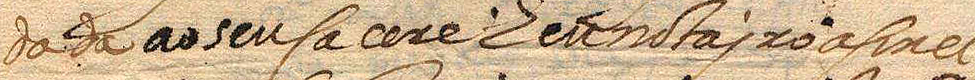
dada ao Cacere E eu notajro asinei
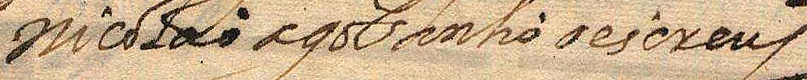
nicolao agostinho o escreuj
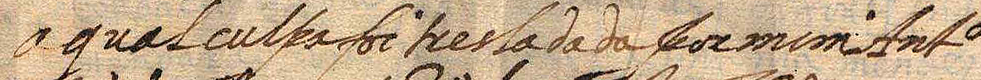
a qual culpa foi tresladada por mim Anto
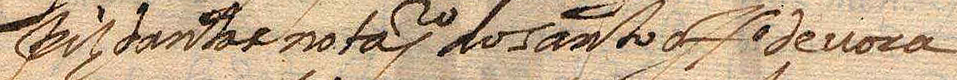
piz̄ dantas notajro do santo offo deuora
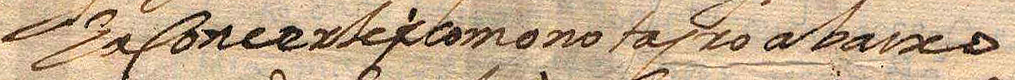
E a Concertej com o notajro abaixo
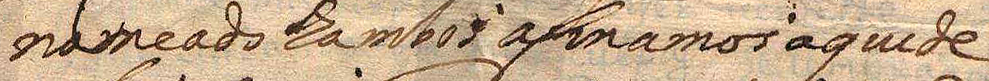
nomeado E ambos asinamos aqui de
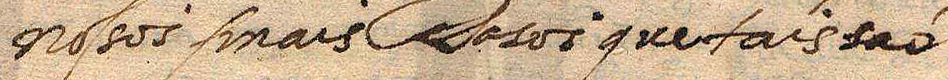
nossos Sinais Rasos que tais saõ
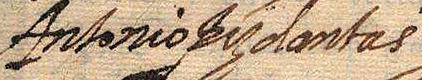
Antonio piz̄ dantas
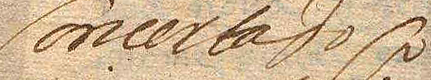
Concertado Co
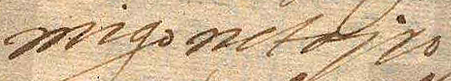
migo notajro
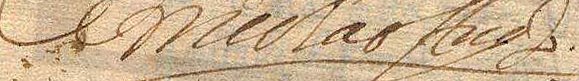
nicolao Augto.
